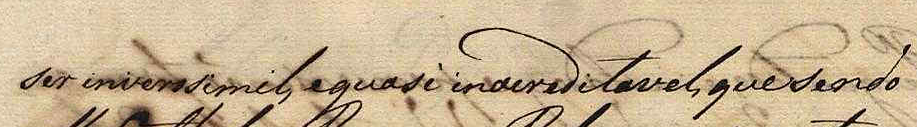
ser inverosimil, e quase inacreditavel, que sendo
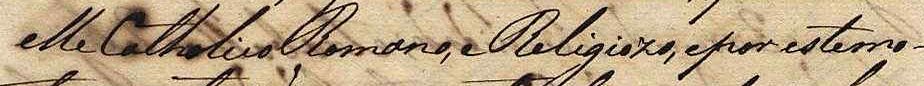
elle Catholico Romano, e Religiozo, e por este mo
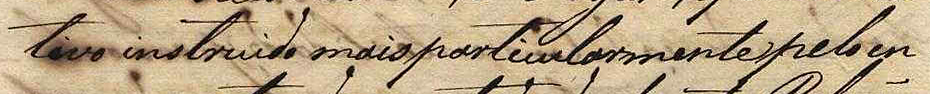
tivo instruido mais particularmente pelo en
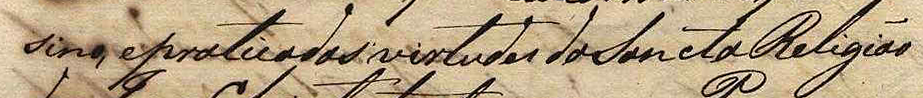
sino, e pratica das virtudes da Sancta Religiaõ
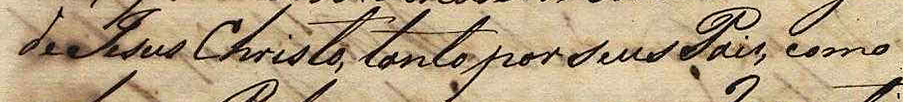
de Iesus Christo, tanto por seus Pais, como
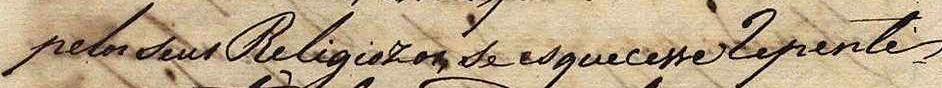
pelos seus Religiozos, se esquecesse Repenti
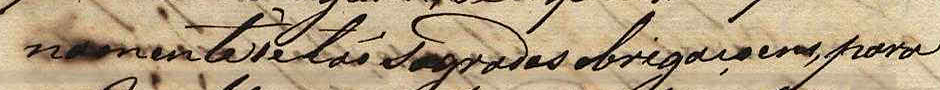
namente de taõ sagradas obrigaçoens, para
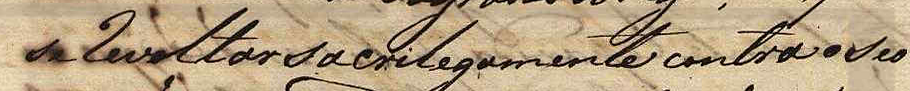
se Revoltar sacrilegamente contra o seo
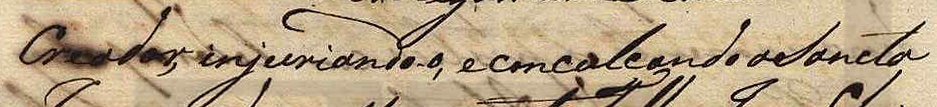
Creador, injuriando-o, e conculcando a Sancta
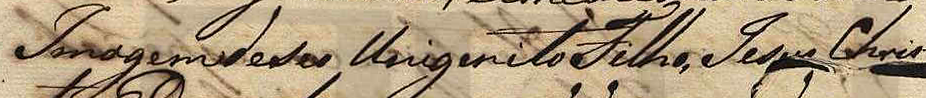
Imagem de seo Unigenito Filho, Iesus Chris
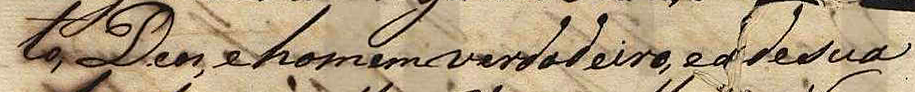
to, Deos, e homem verdadeiro, e a de sua
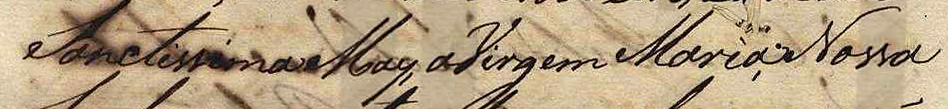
Sanctissima May, a Virgem Maria, Nossa
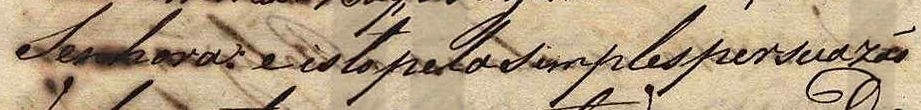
Senhora, e isto pela simples persuazaõ
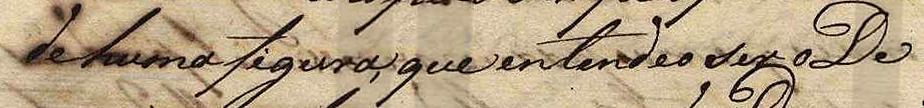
de huma figura, que entendeo ser o De
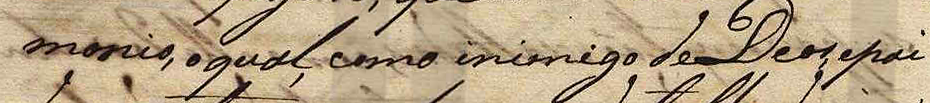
monio, o qual como inimigo de Deos, e pai
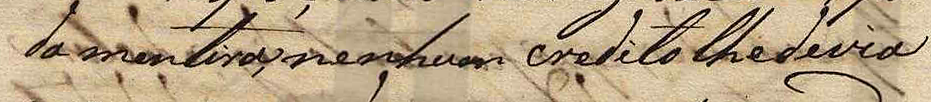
da mentira, nenhum credito lhe devia
